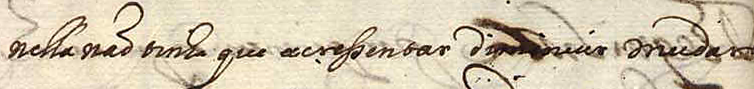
nella naõ tinha que acressentar diminuir mudar _
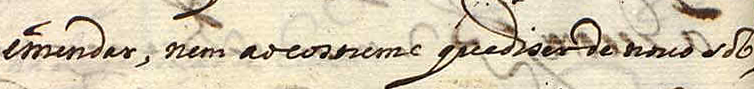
em̄endar, nem ao costume que diser de nouo e sob
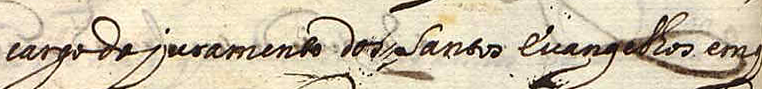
cargo do juramento dos Santos Euangelhos em q̄
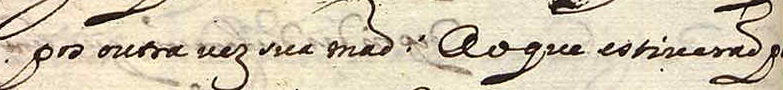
pos outra uez sua maõ. Ao que estiueraõ pr_
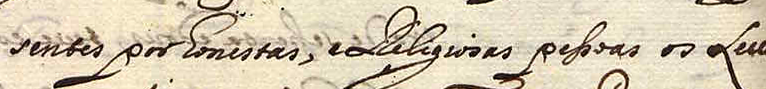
sentes por honestas, e Religiosas pessoas os Lece_
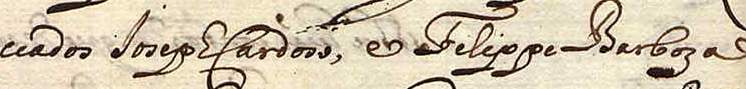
ceados Joseph Cardoso, e Felippe Barboza
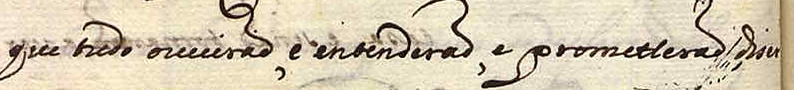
que tudo ouuiraõ e entenderaõ, e prometteraõ diser
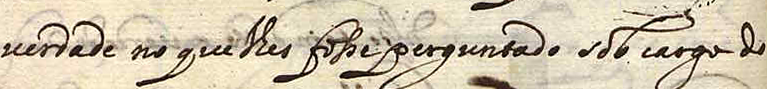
uerdade no que lhes fosse perguntado sob cargo do
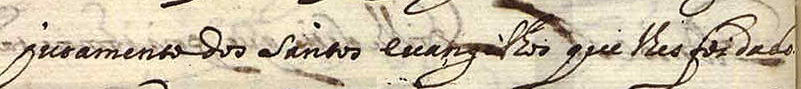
juramento dos Santos euangelhos que lhes foi dado
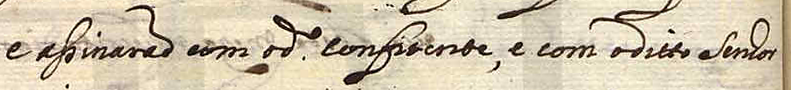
e assinaraõ com o d.o confitente, e com o ditto Senhor
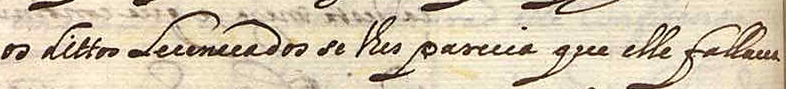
os dittos Lecenceados se lhes parecia que elle fallaua
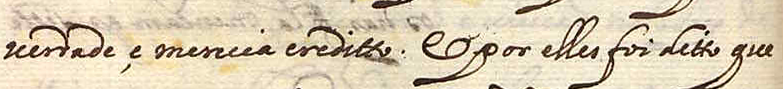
uerdade, e merecia creditto. E por elles foi ditto que
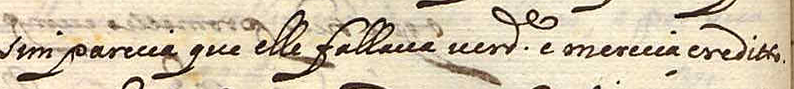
sim parecia que elle fallaua uerd.e e merecia creditto.
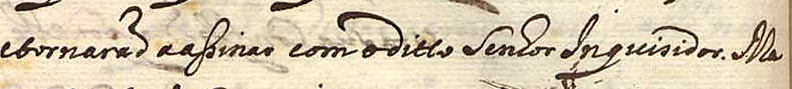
e tornaraõ a assinar com o ditto Senhor Inquisidor. Ma
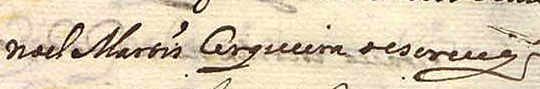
noel Martīs Cerqueira o escreuy
